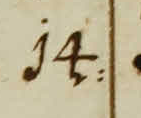14:
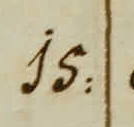15:
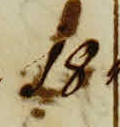18
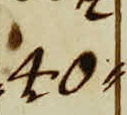40
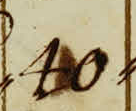40
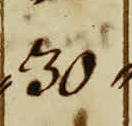30
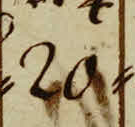20
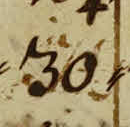30
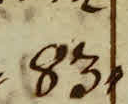83
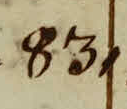83
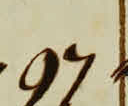97
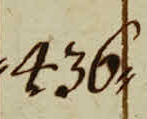436
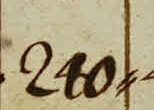240
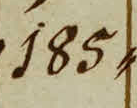185
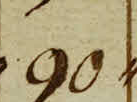90
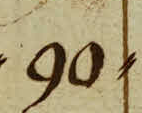90
